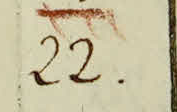22.
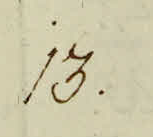13.
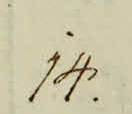14.
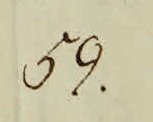59.
